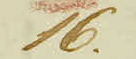16.
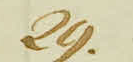29.
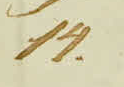14.
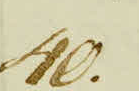40.
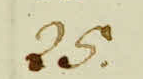25.
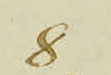8
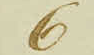6
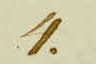4.
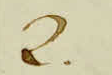2.
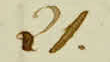21.
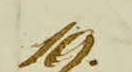19.
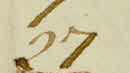27
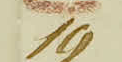19
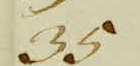35
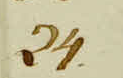24.
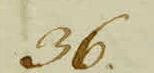36.
